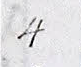4
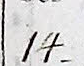14
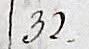32
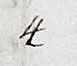4
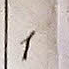1
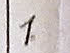1
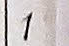1
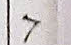7
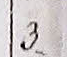3
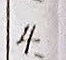4
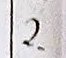2
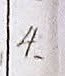4
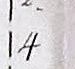4
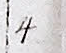4
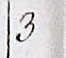3
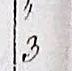3
